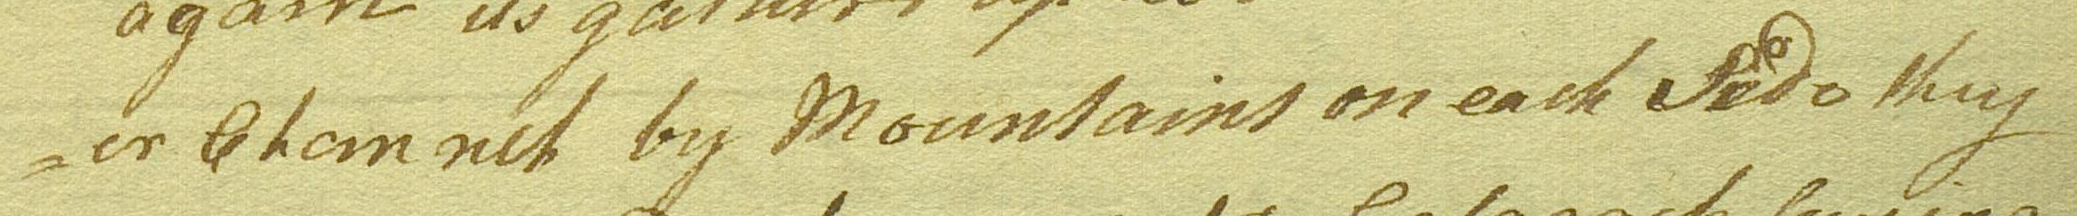-er Channel by Mountains on each Side they
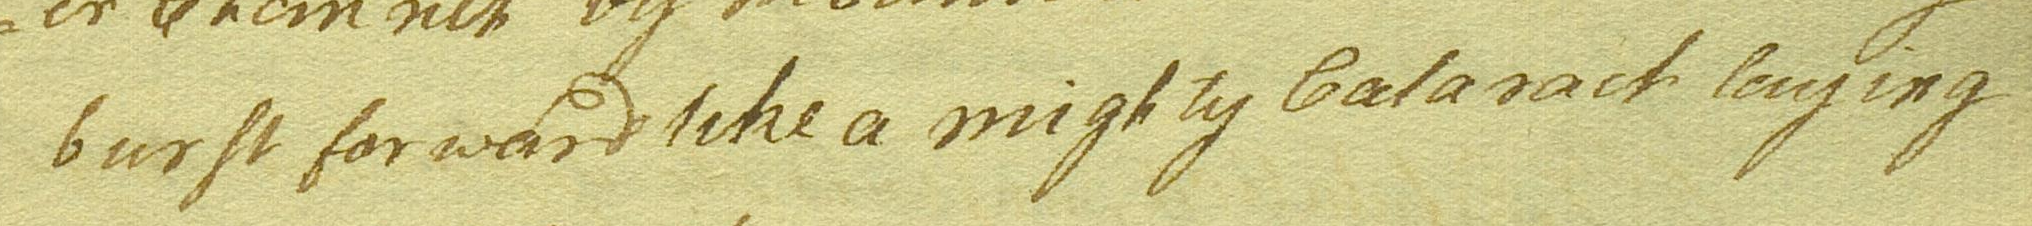burst forward like a mighty Cataract levying
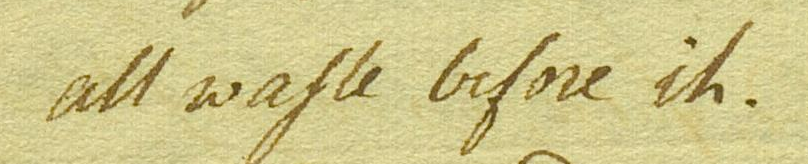all waste before it.
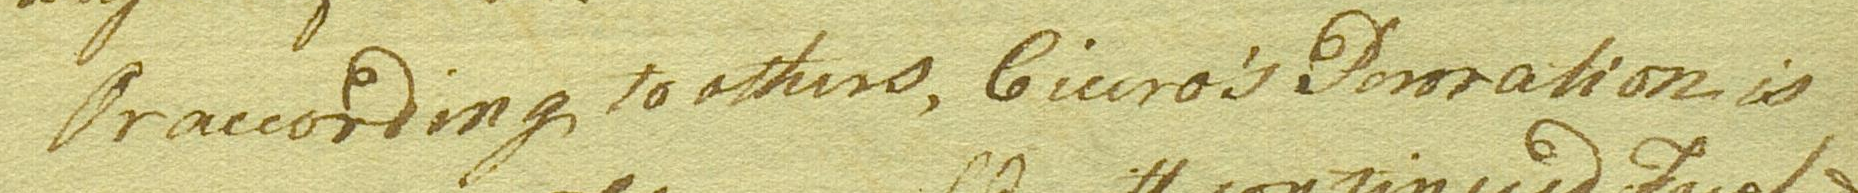Or according to others, Cicero's Peroration is
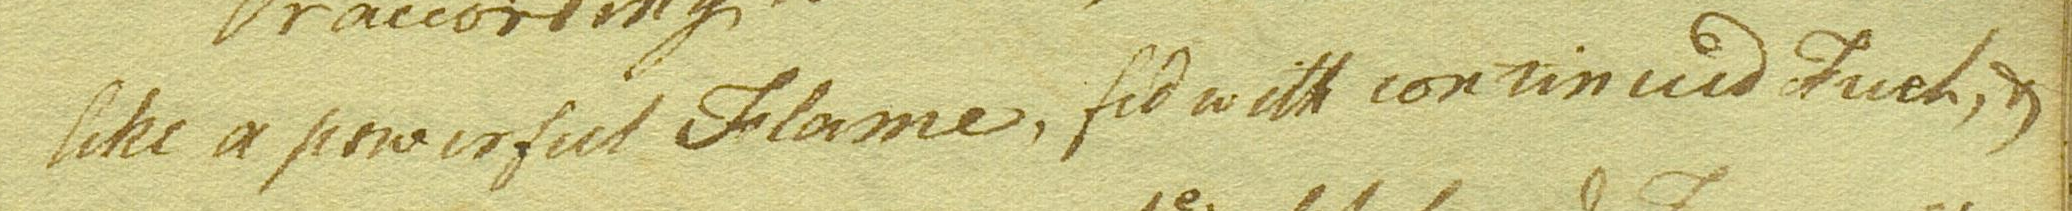like a powerful Flame, fed with continued Fuel, &
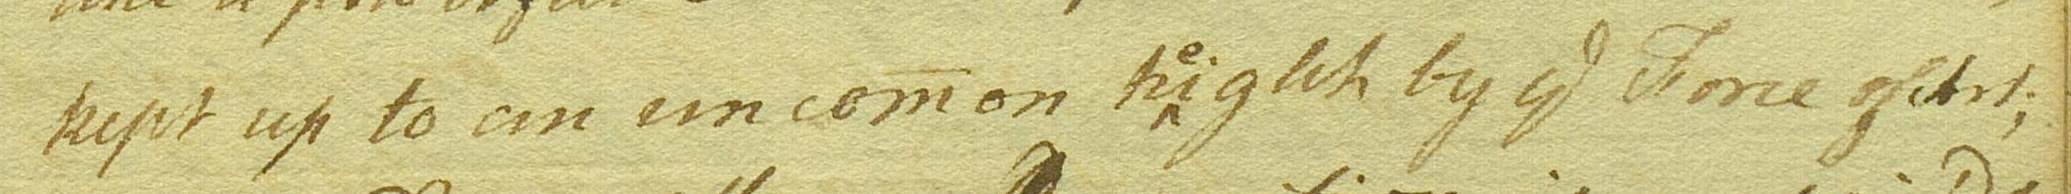kept up to an uncomon h^eight by y^e Force of it;
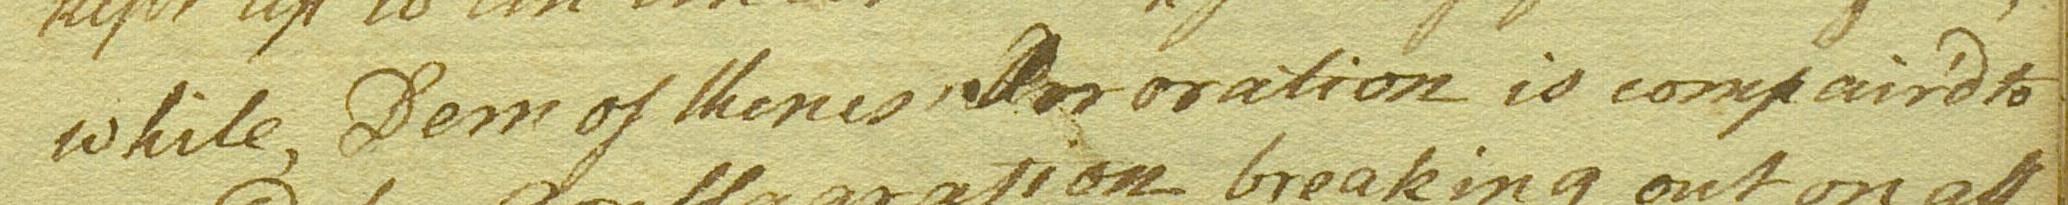while, Demosthenes' Peroration is compair'd to
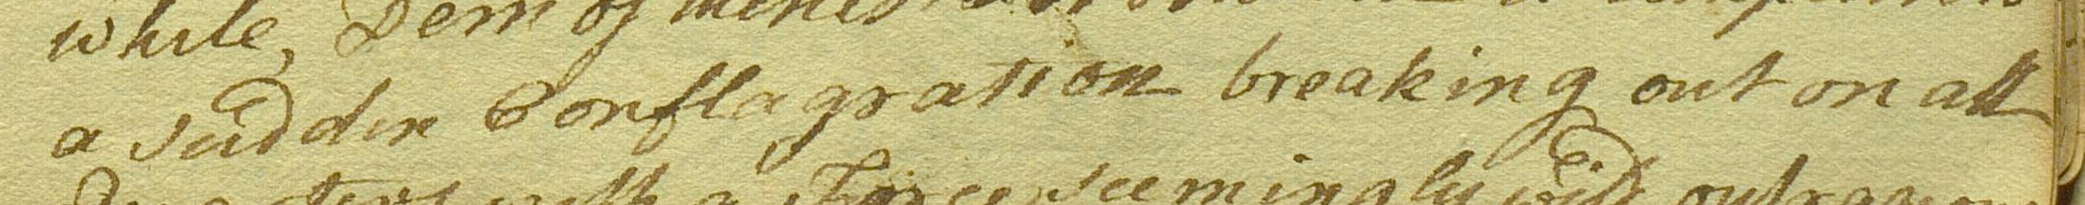a sadder conflagration breaking out on all
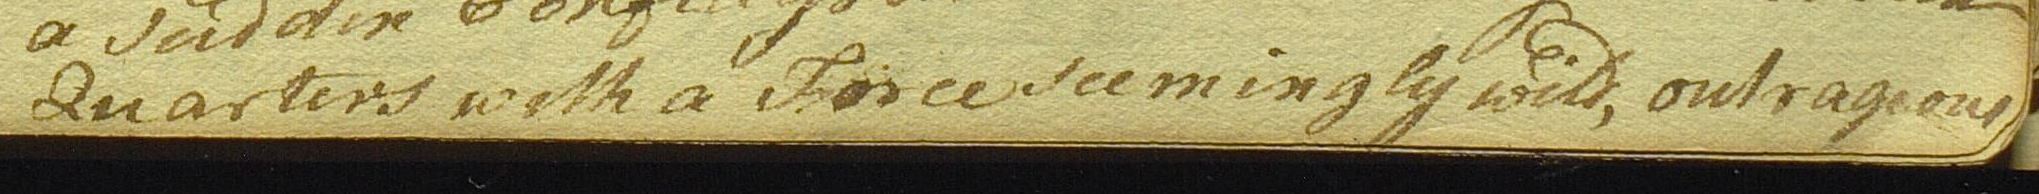Quarters with a Force seemingly wild, outrageous
